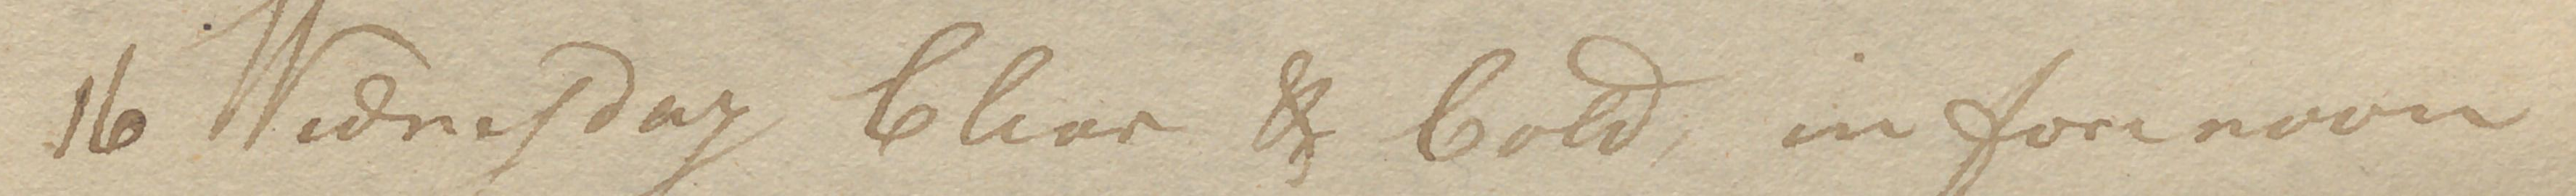16 Wednesday Clear & Cold, in forenoon
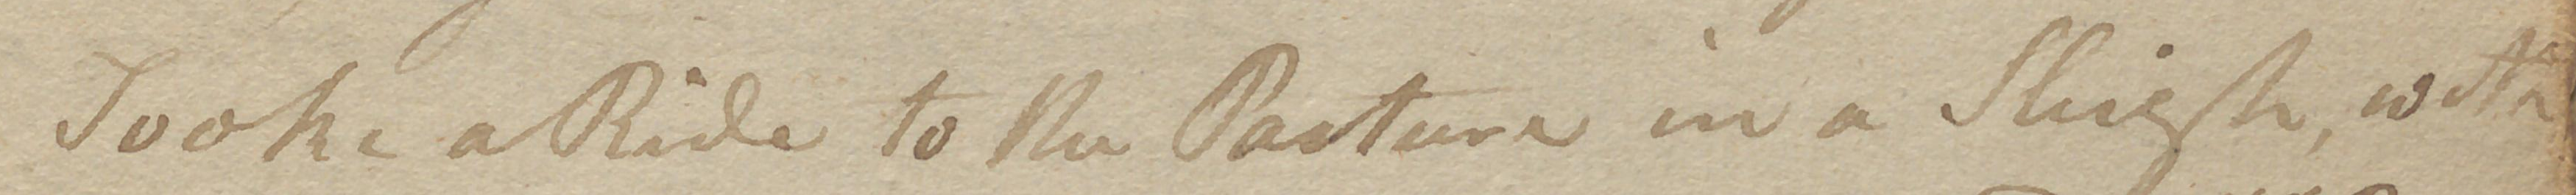Tooke a Ride to the Pasture in a Sleigh with
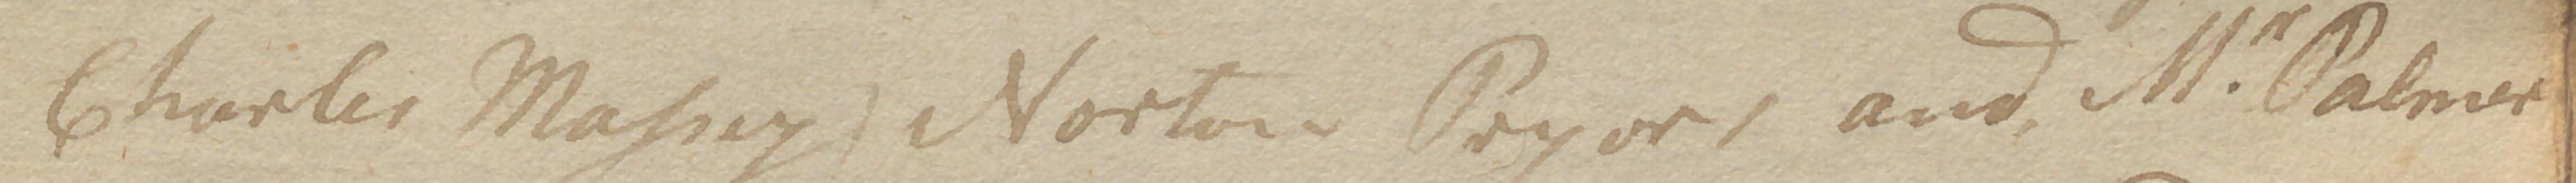Charles Massey Norton Pryor, and M^r. Palmer
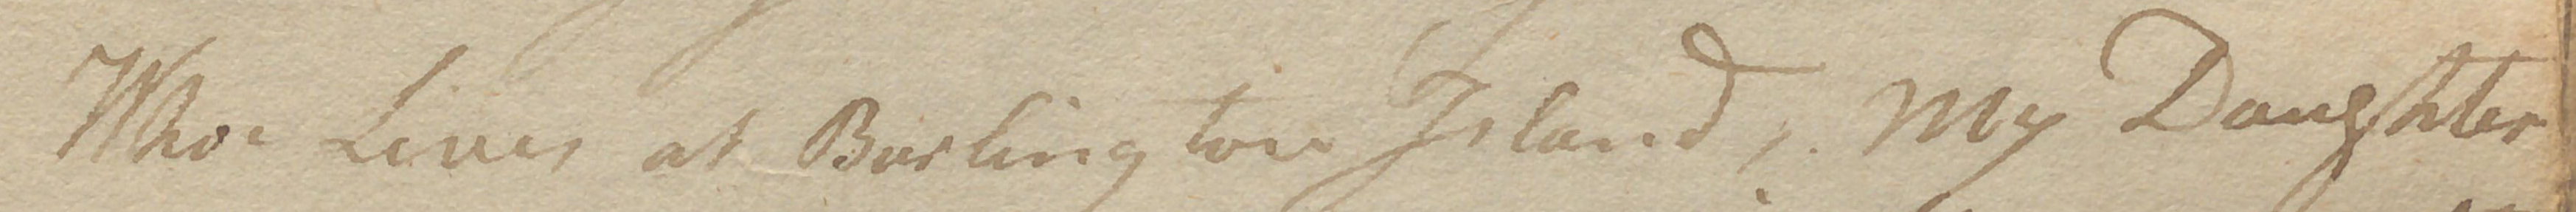Whoe Lives at Burlington Island, My Daughter
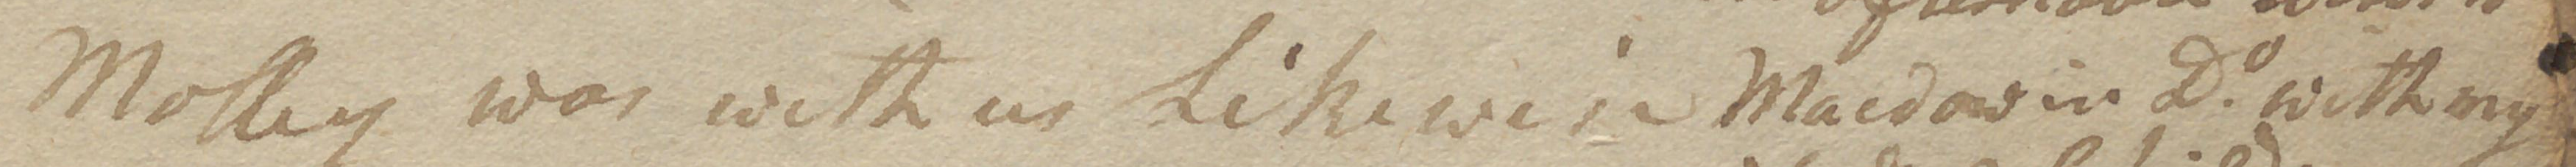Molley was with us Likewise Maedow in D^o. with my
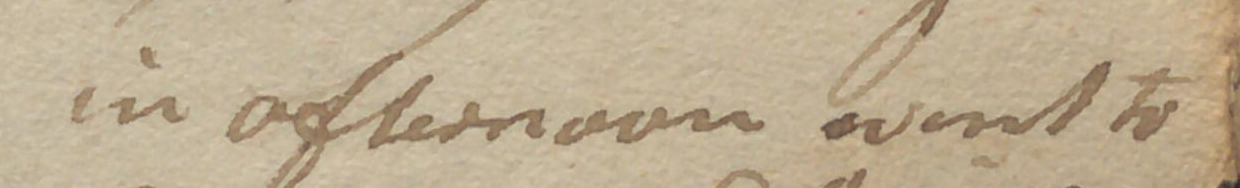in afternoon went to
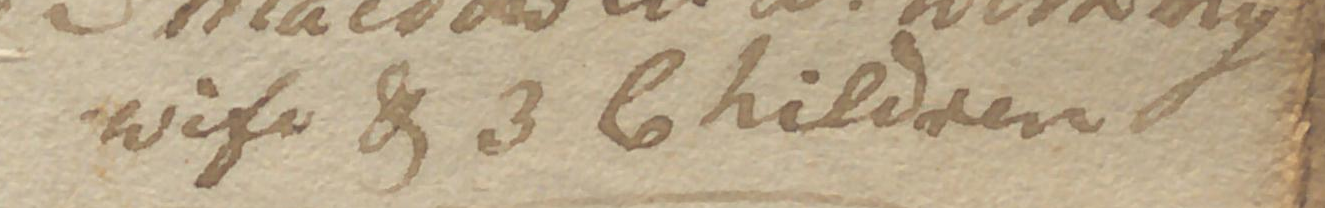wife & 3 Childrent
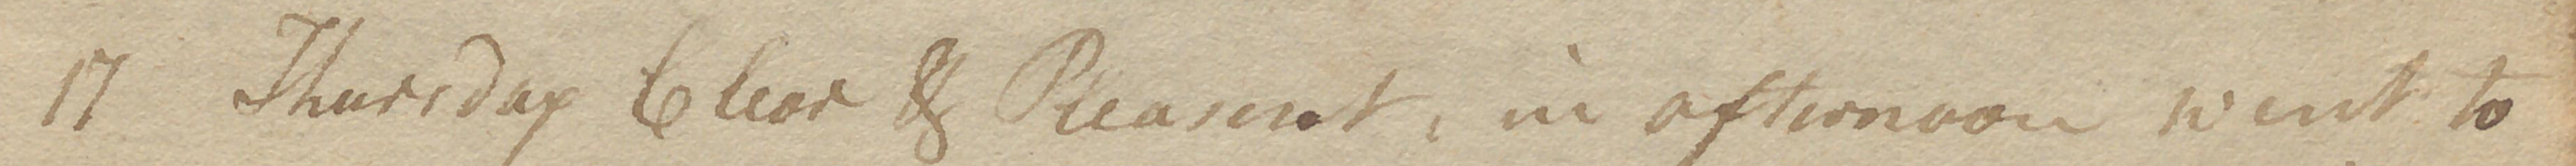17 Thursday Clear & Pleasent, in afternoon went to
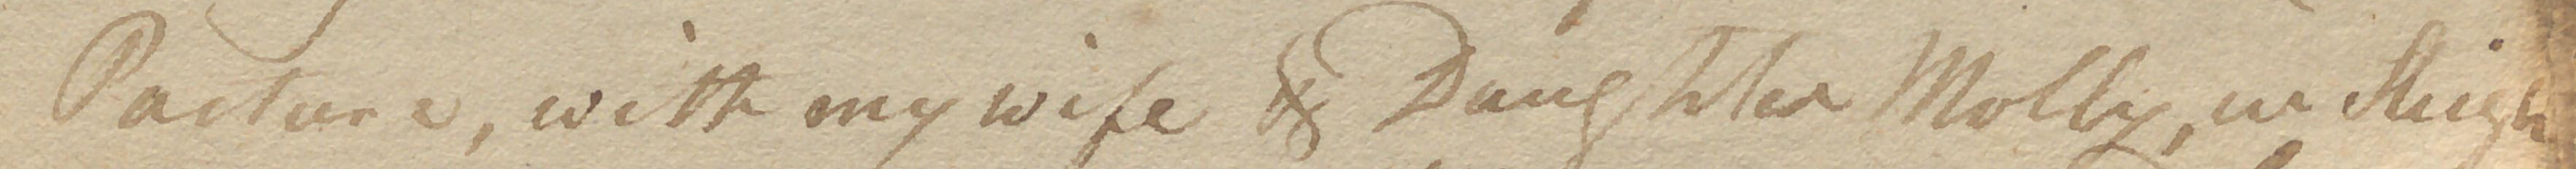Pasture, with my wife & Daughter Molly, in Sleigh
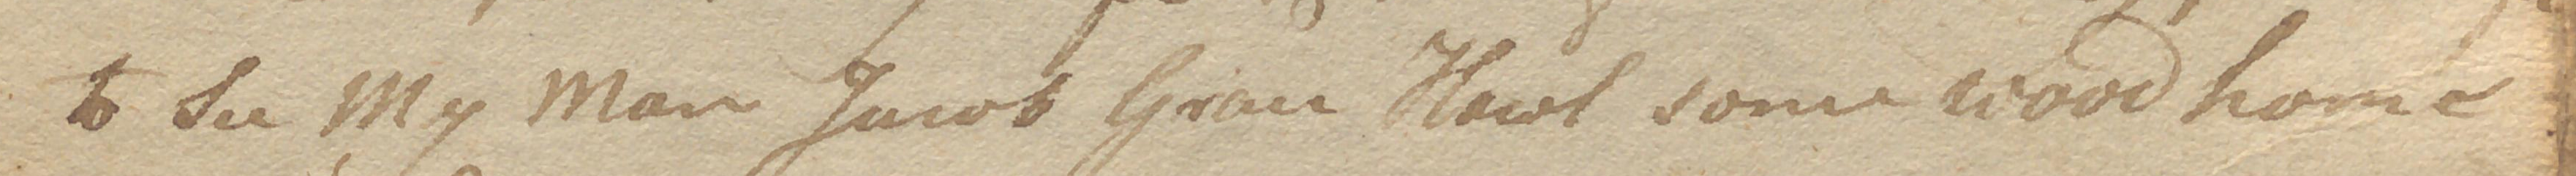to see My Man Jacob Grau Hawl some wood home
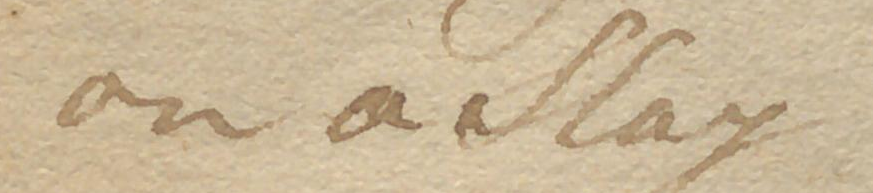on a slay
